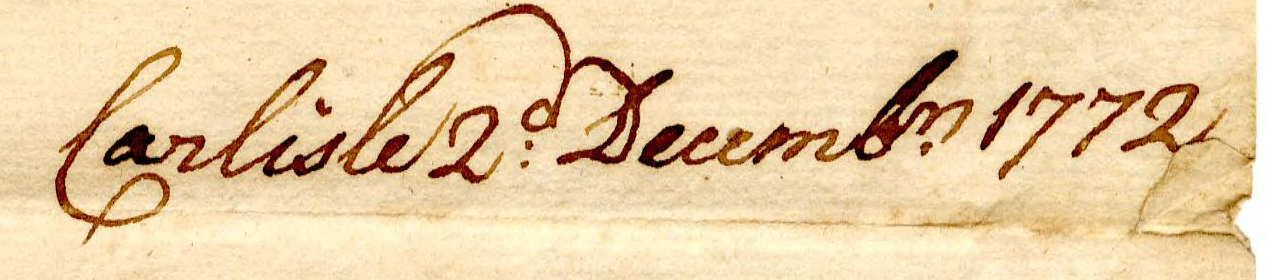Carlisle 2^d. Decmb^r. 1772
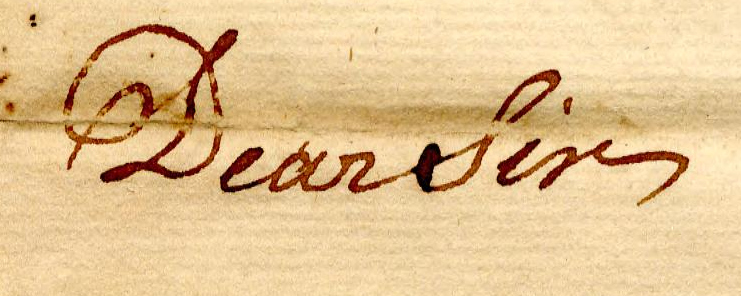Dear Sir
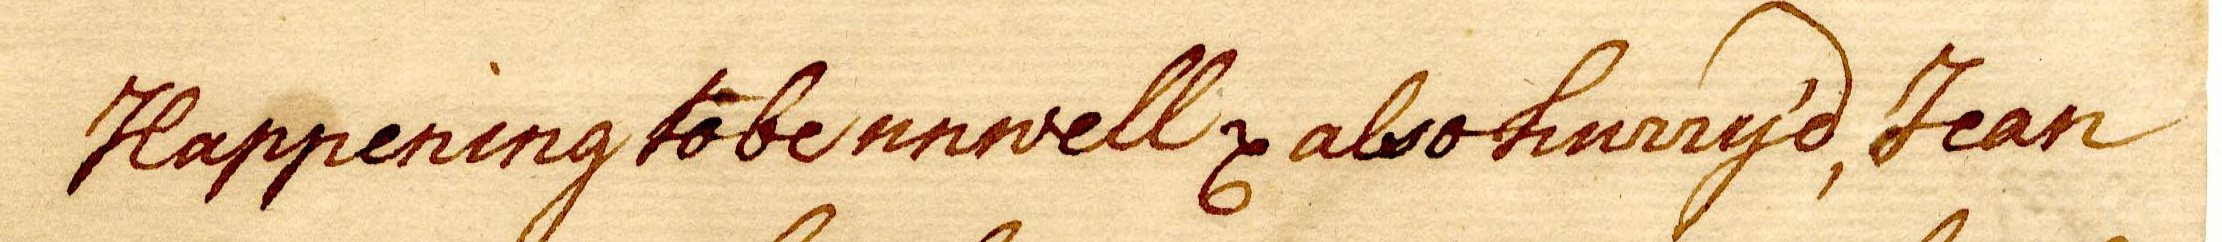Happening to be unwell & also hurry'd, I can
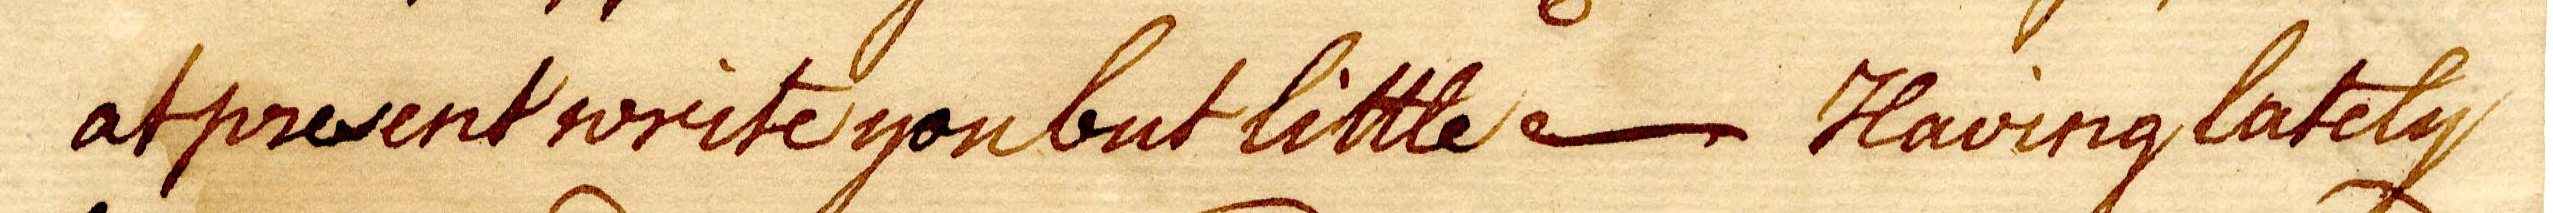at present write you but little- Having lately
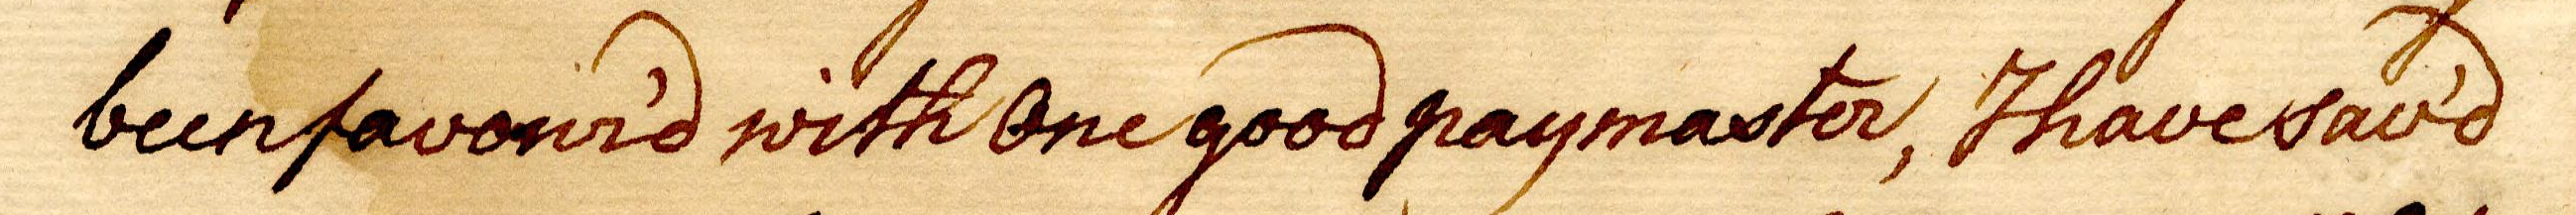been favour'd with one good paymaster, I have sav'd
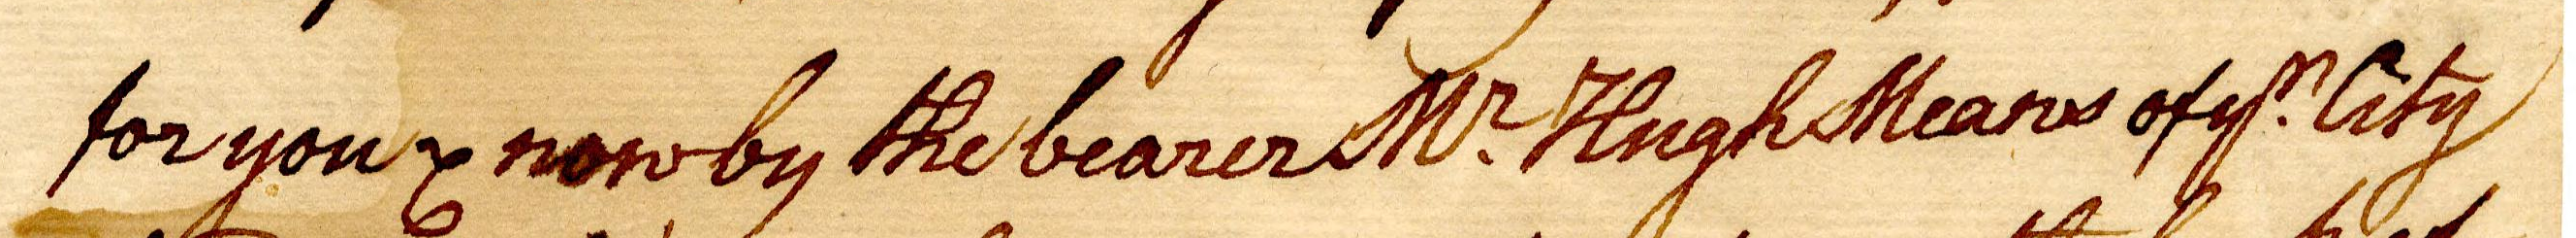for you & now by the bearer M^r. Hugh Mears of y^r. City
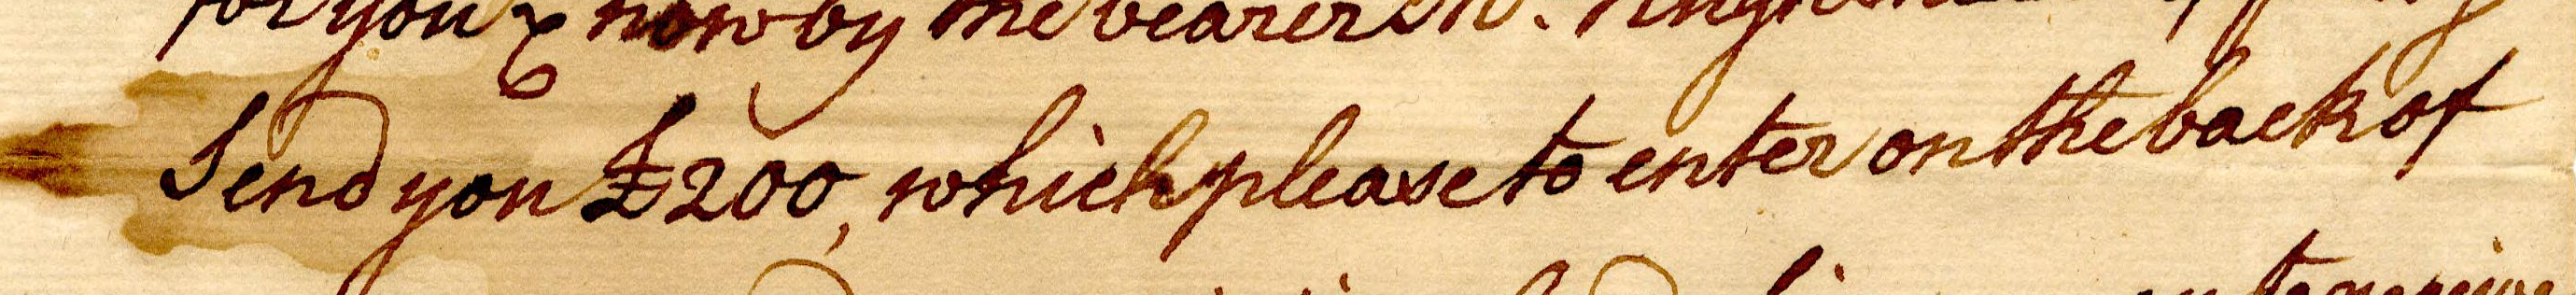Send you £200, which please to enter on the back of
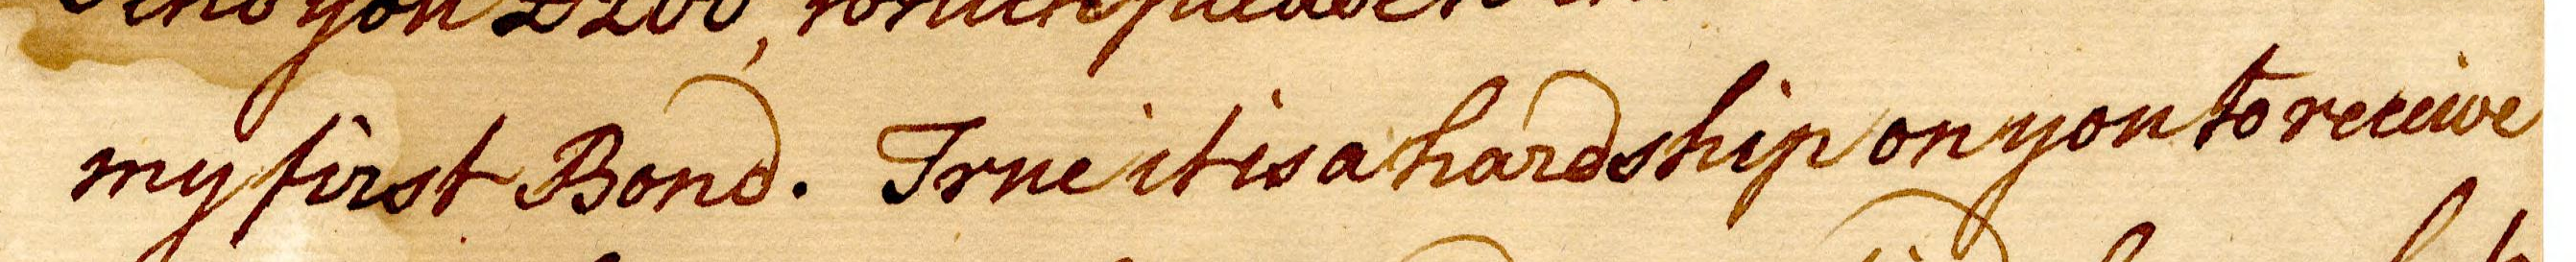my first Bond. True it is a hardship on you to receive
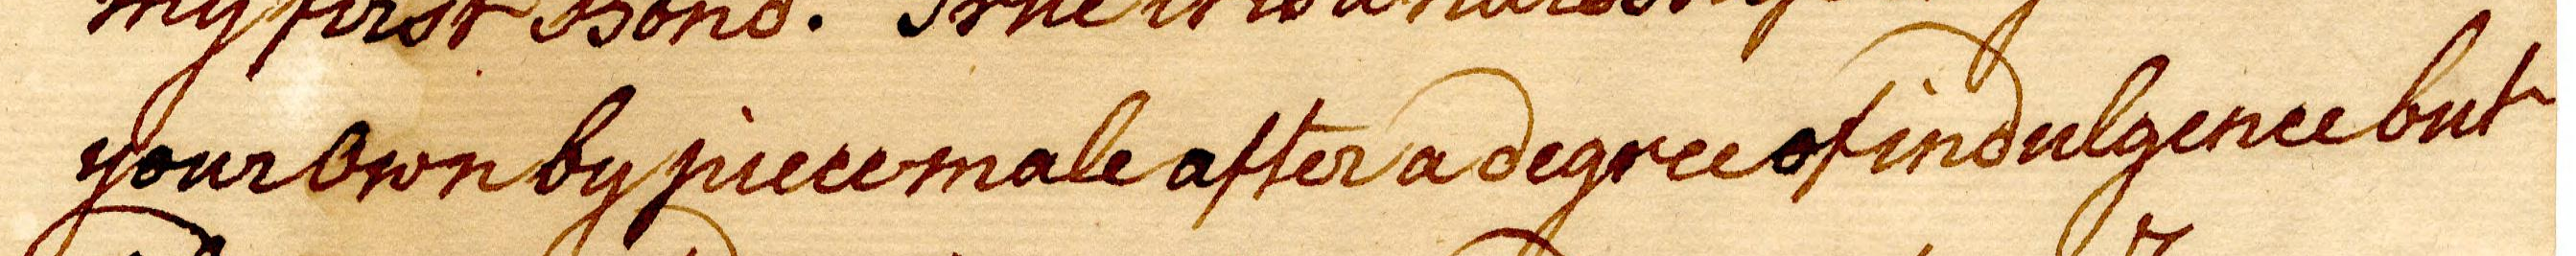your own by piecemale after a degree of indulgence but
